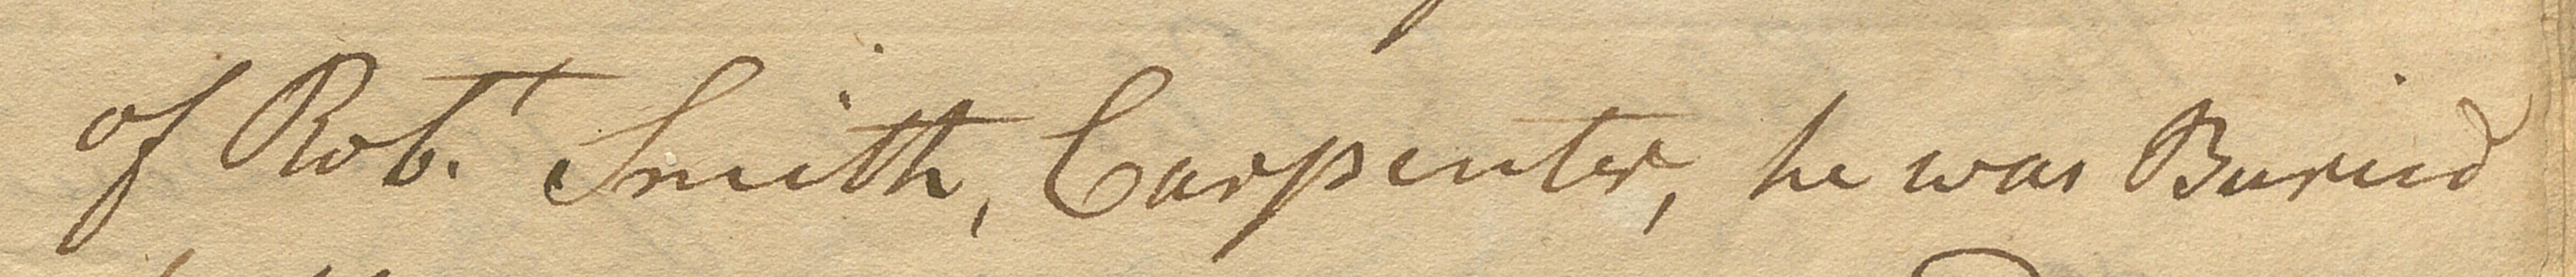of Rob^t. Smith, Carpenter, he was Buried
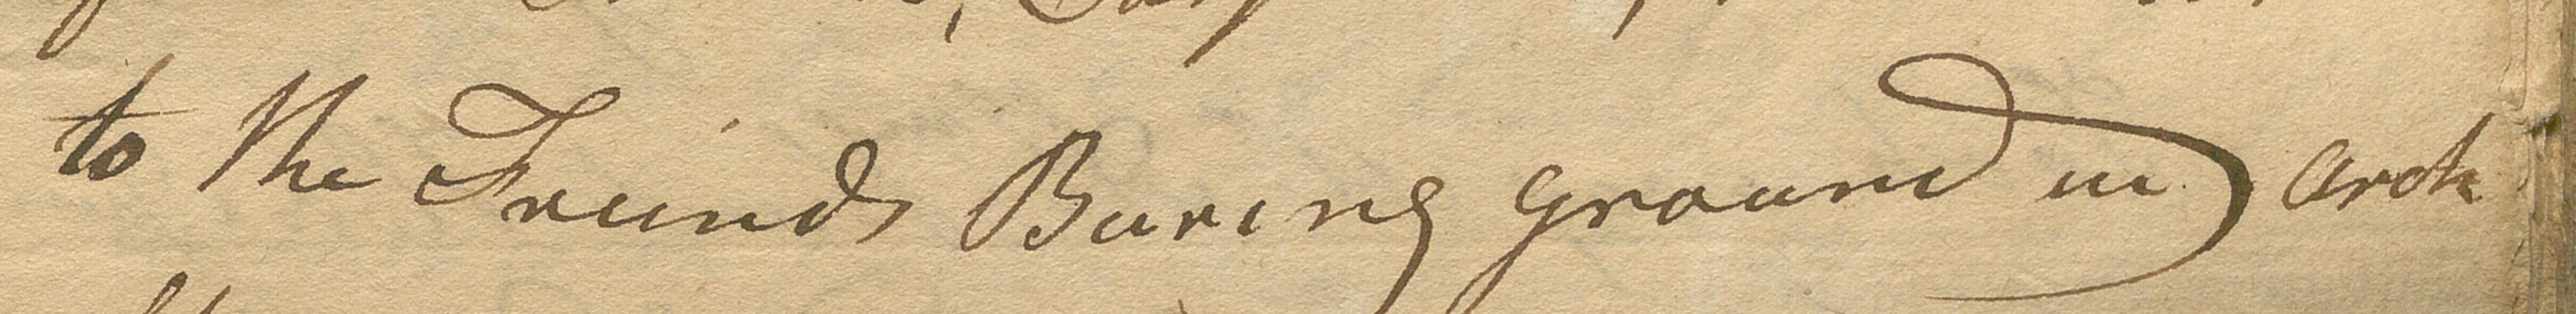to the Friends Buring ground in Arch
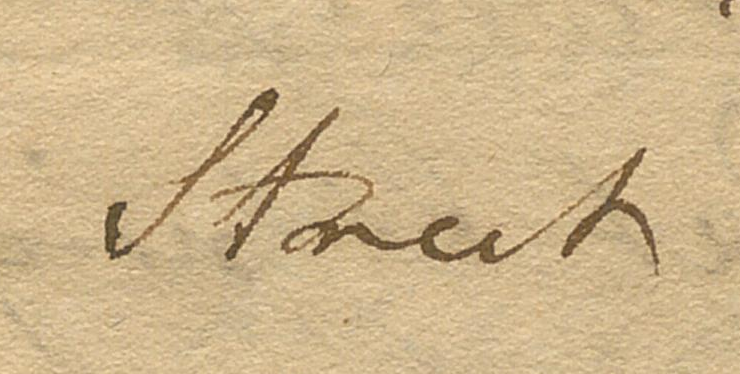Street
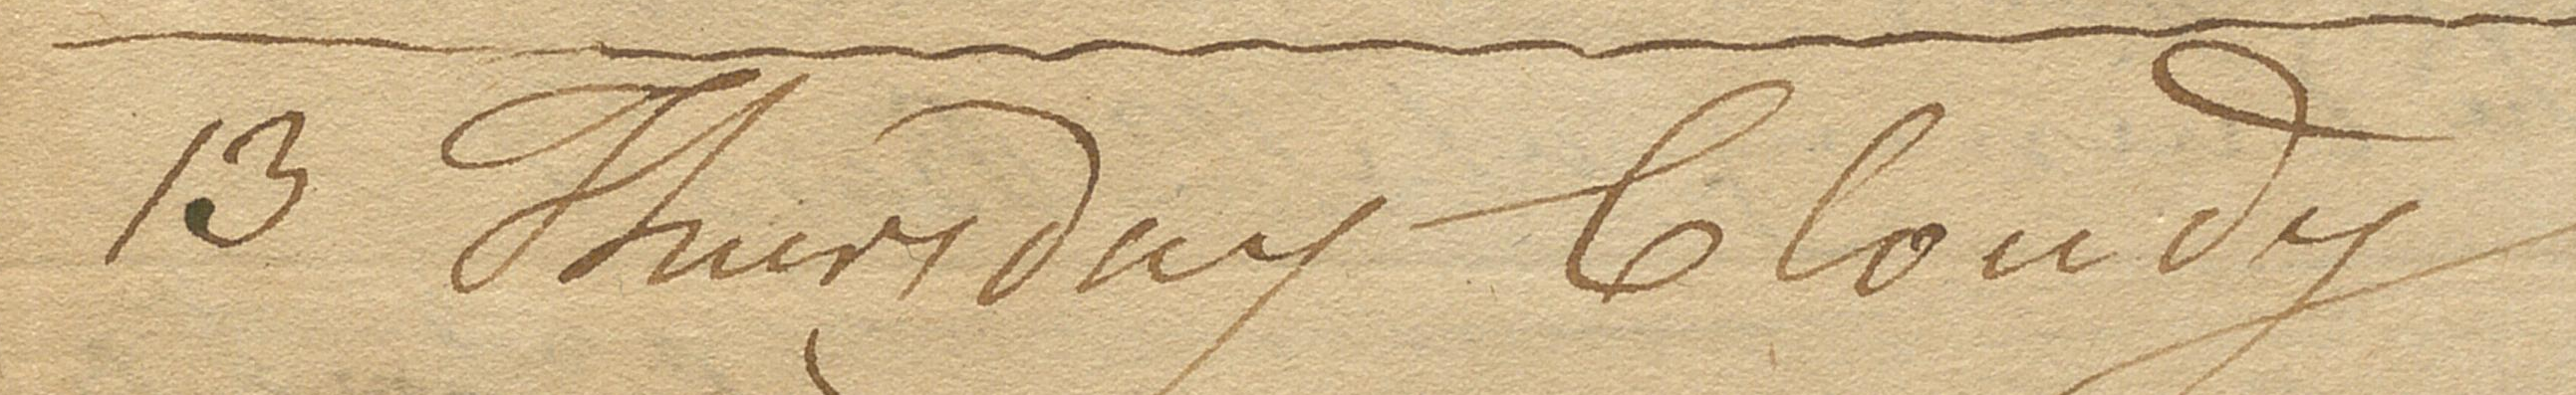13 Thursday Cloudy
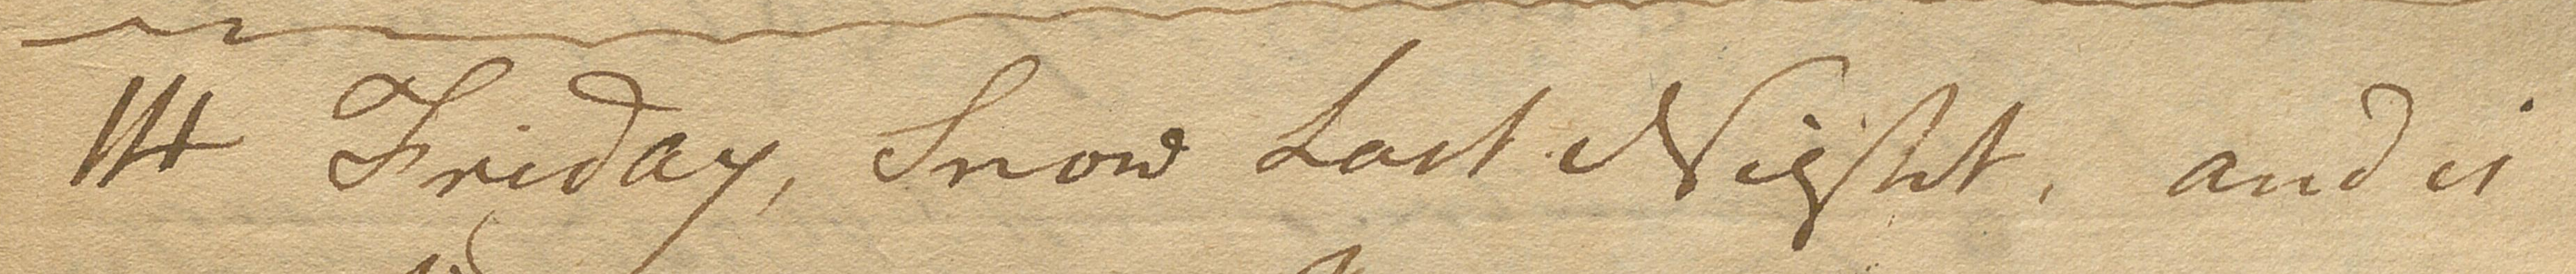14 Friday, Snow Last Night, and is
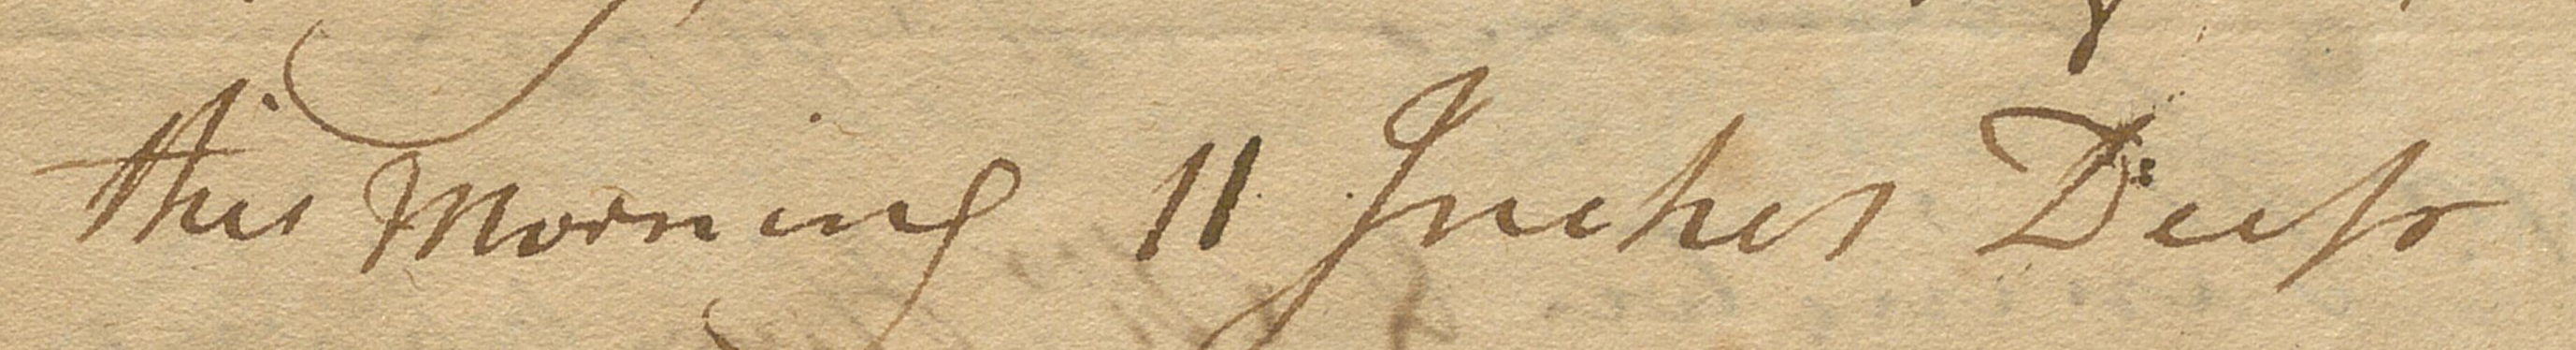this Morning 11 Inches Deep
